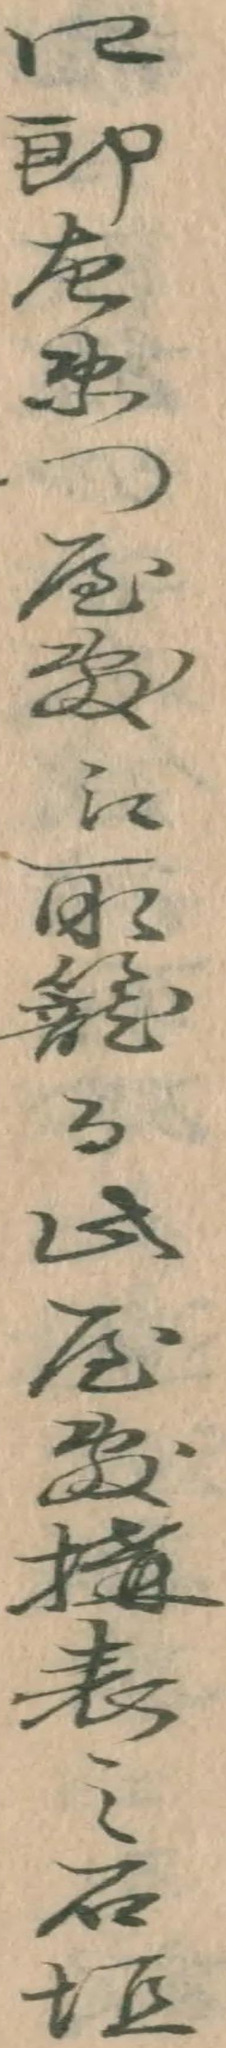四郎左衛門屋敷え取籠る此屋敷構表之石垣
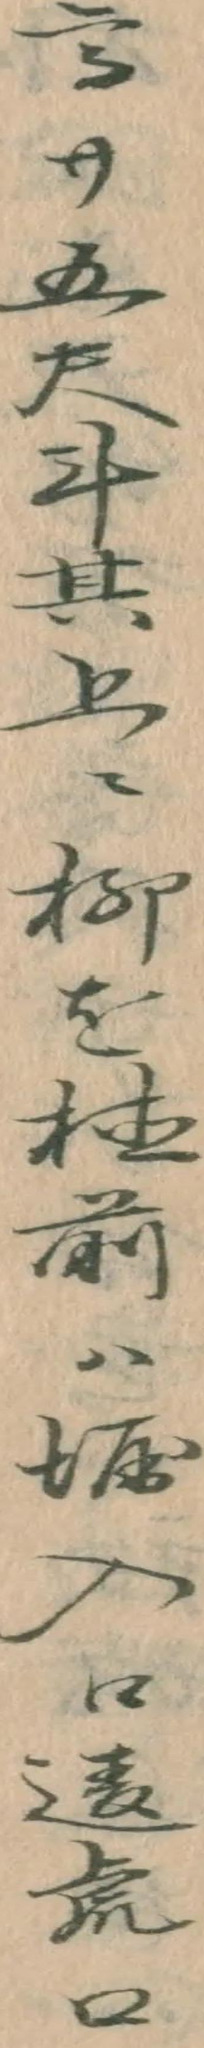高廿五尺斗其上に柳を植前は堀入口違虎口
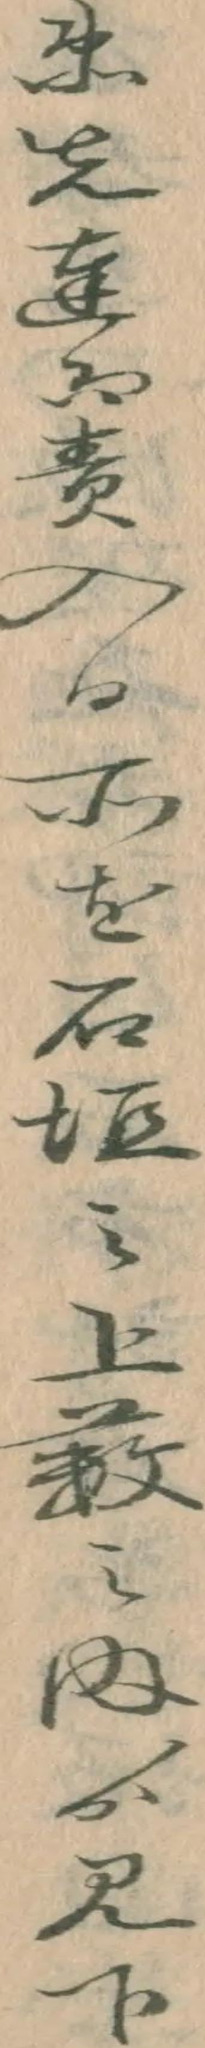衛先達而責入る所を石垣の上薮之内ゟ見下
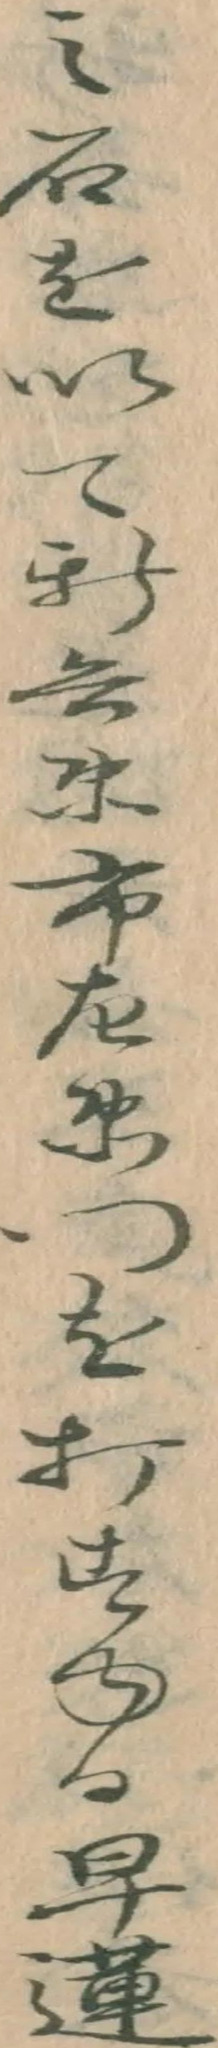之石を以て新兵衛市左衛門を打すゆる早蓮
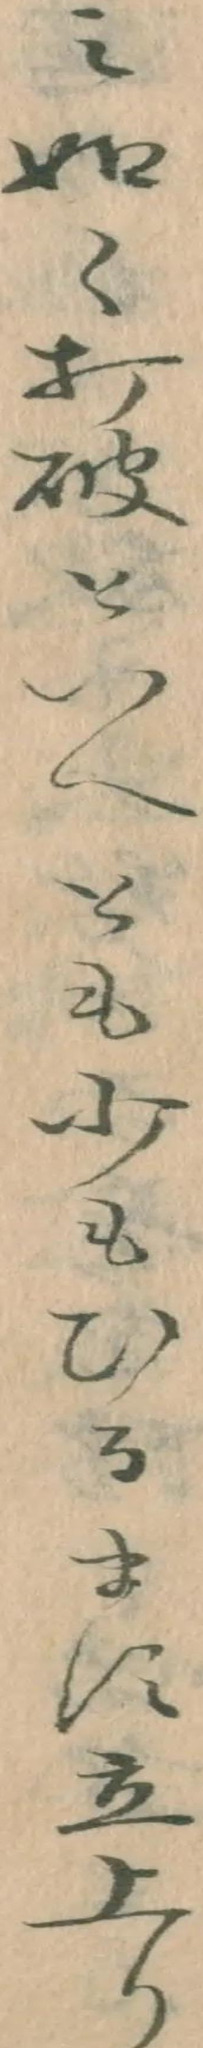之如く打破といへとも少もひるます立上り

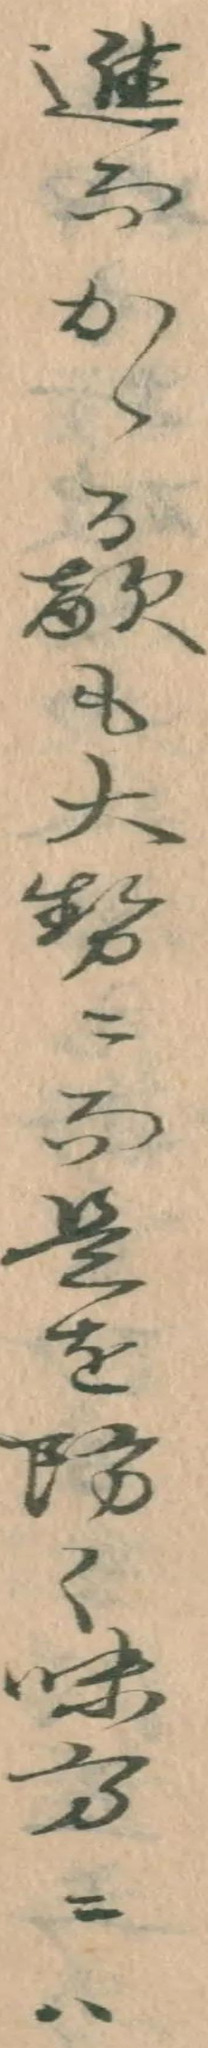進而かゝる敵も大勢に而是を防く味方には
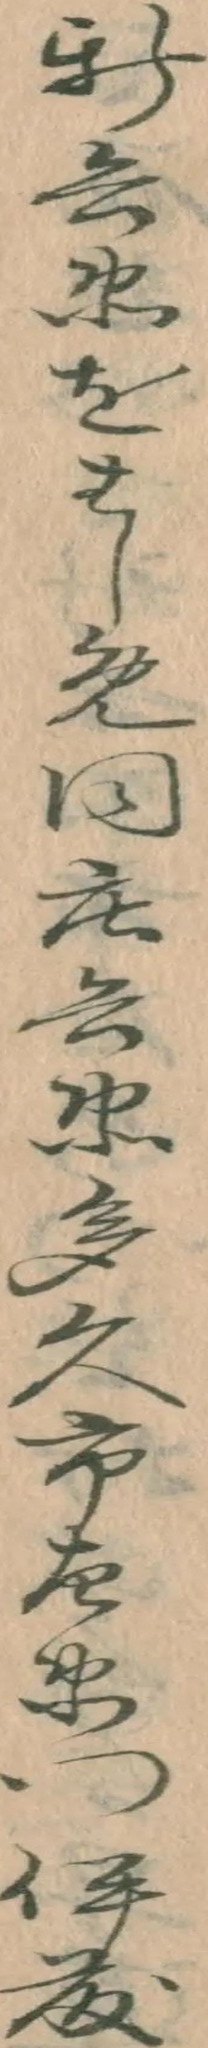新兵衛をはしめ同庄兵衛多久市左衛門伊藤
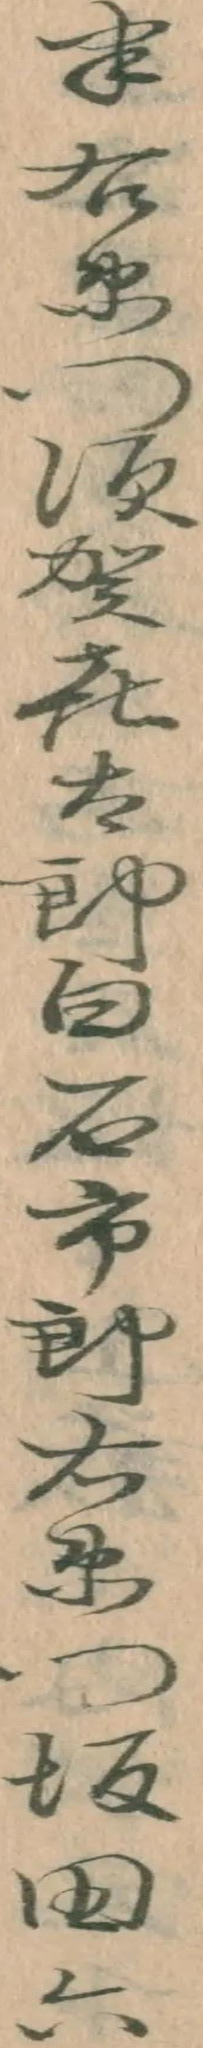半右衛門須賀喜太郎白石市郎右衛門坂田六
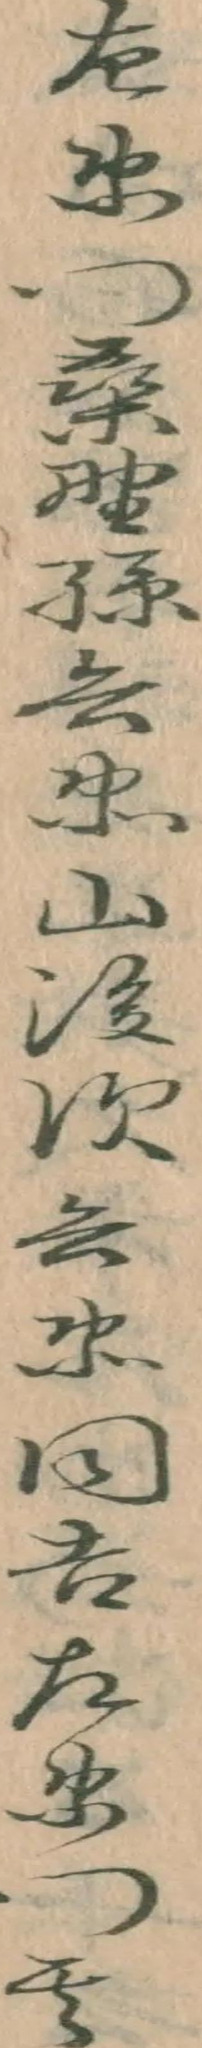左衛門桑野孫兵衛山後次兵衛同吉左衛門其
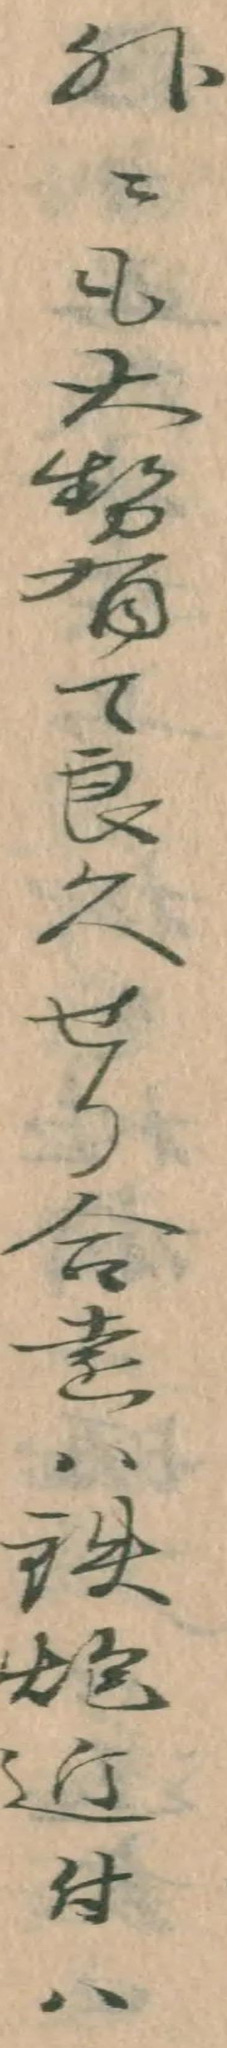外にも大勢有て良久せり合遠は鉄炮近付は
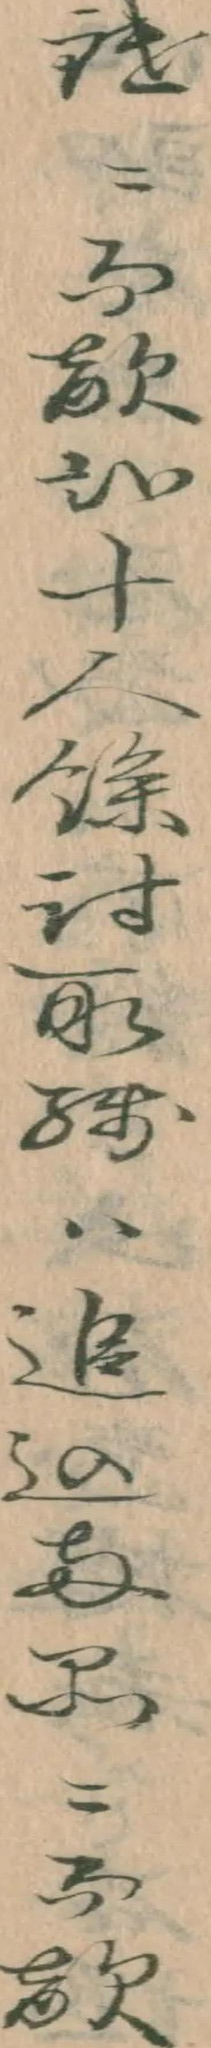鑓に而敵弐十人余討取残は追込両所に而敵
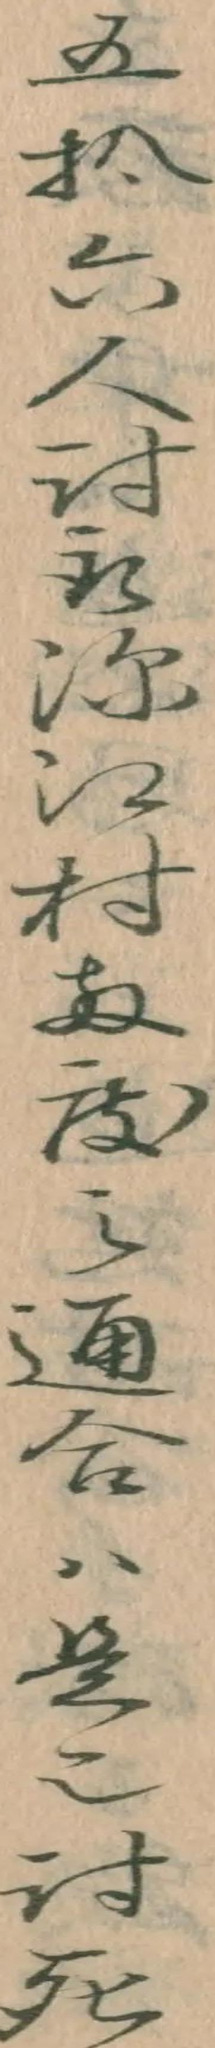五拾六人討取深江村両度之通合は是也討死
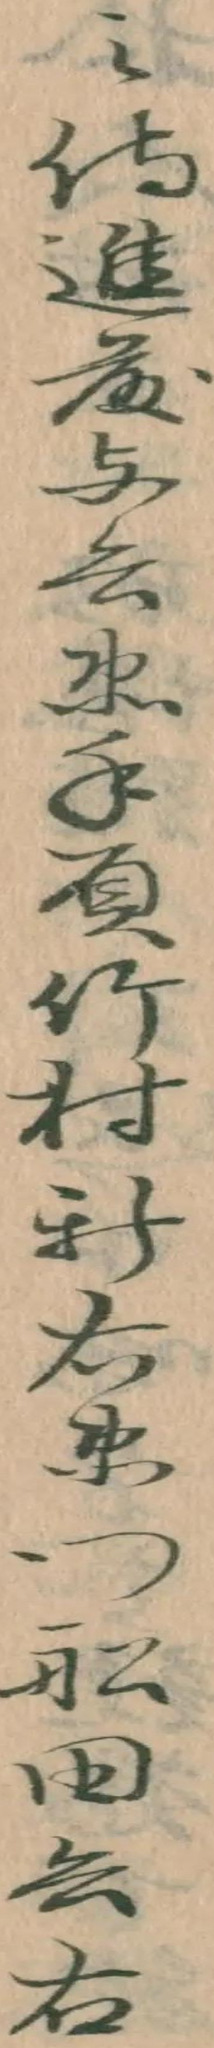之侍進藤与兵衛手負竹村新右衛門船田兵右
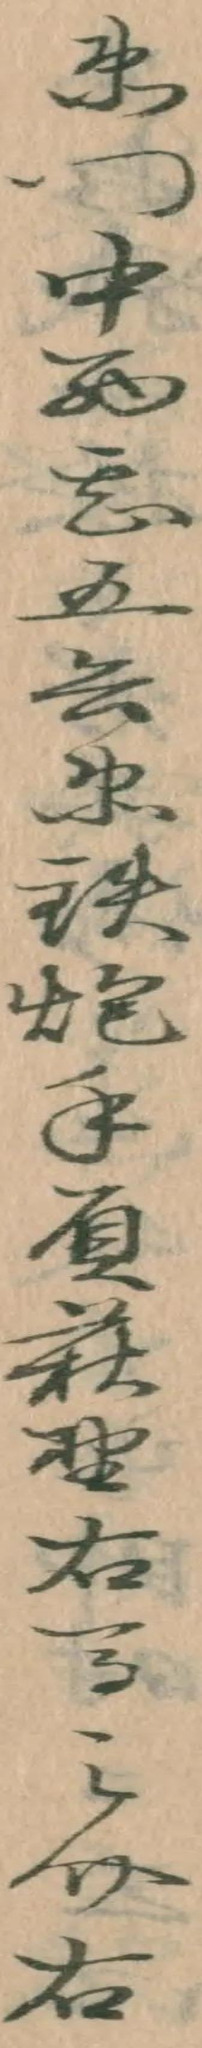衛門中西甚兵衛鉄炮手負萩野右馬之介右
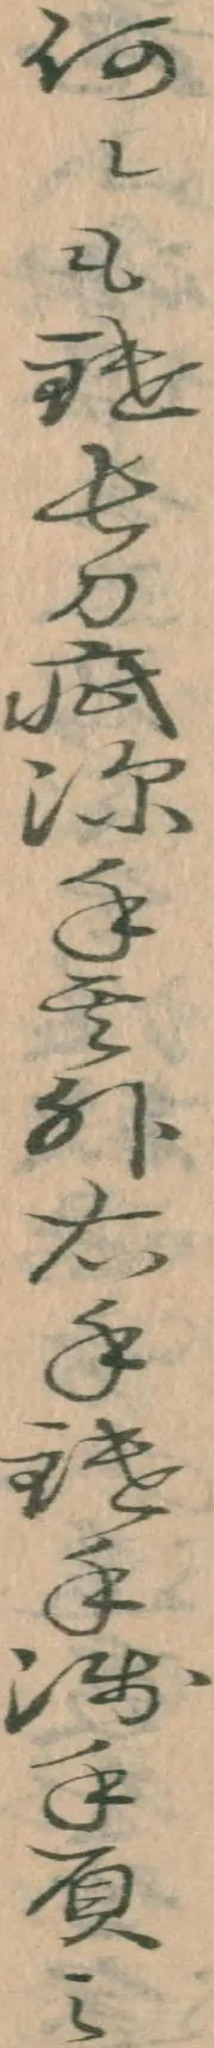何れも鑓長刀疵深手其外右手鑓手浅手負之
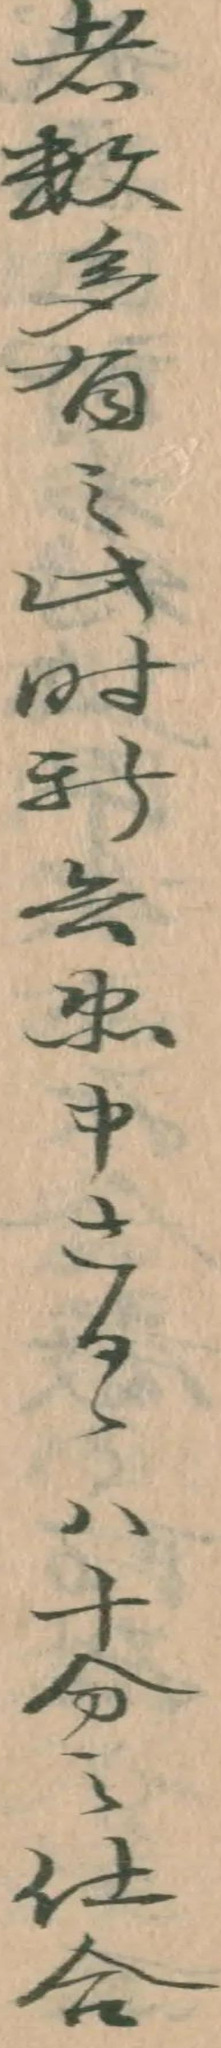者数多有之此時新兵衛申さるゝは十分之仕合
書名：切支丹御退治記 49巻. [1]
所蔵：国立国会図書館 National Diet Library, JAPAN
